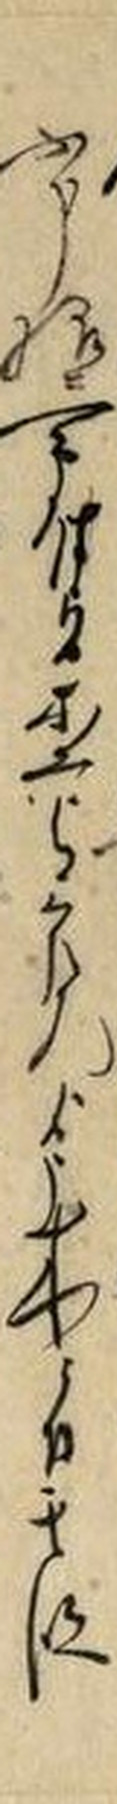不申様可申付旨杢与三左衛門ゟ申来に付其段
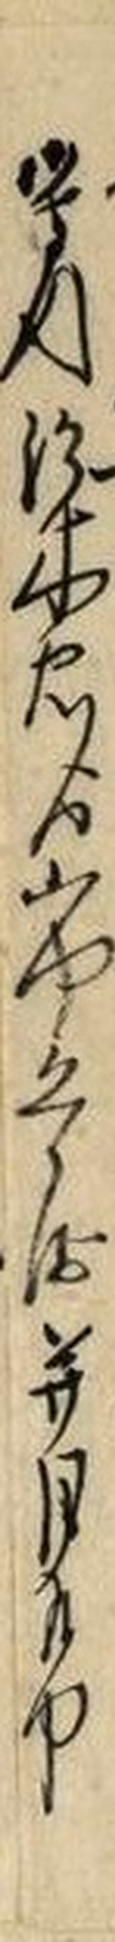御奉行鈴木忠右衛門山中久兵衛并目付中
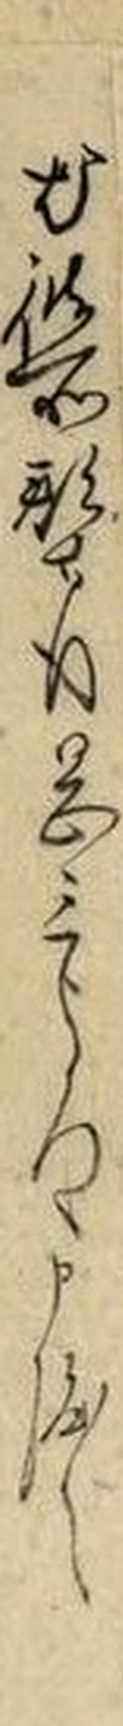尤彼所郡奉行岡三郎右衛門へ申渡之

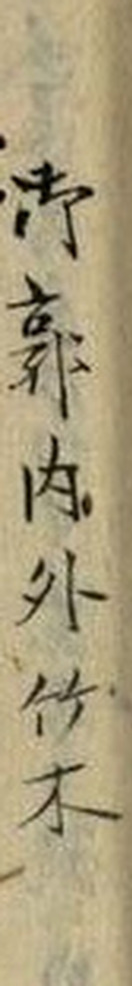御郭内外竹木
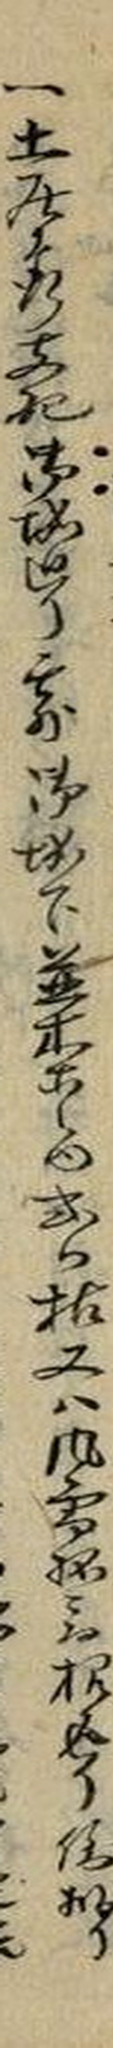一土居奉行支配御城廻り其外御城下並木等之内或は枯又は風雪抔にて根返り倒掛り
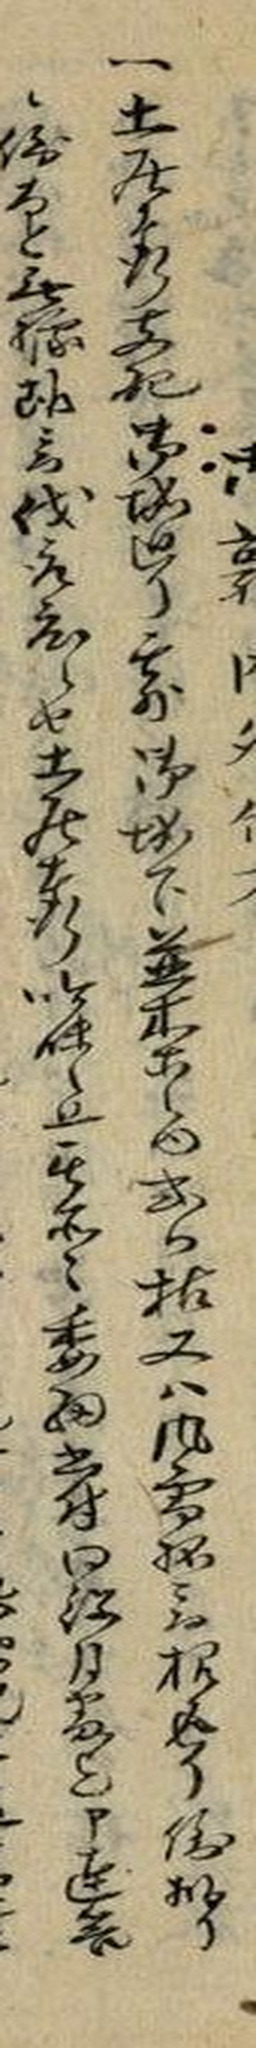候儀なと無拠趣にて伐取度之由土居奉行吟味之上其所々委細書付同役月番迄申達筈
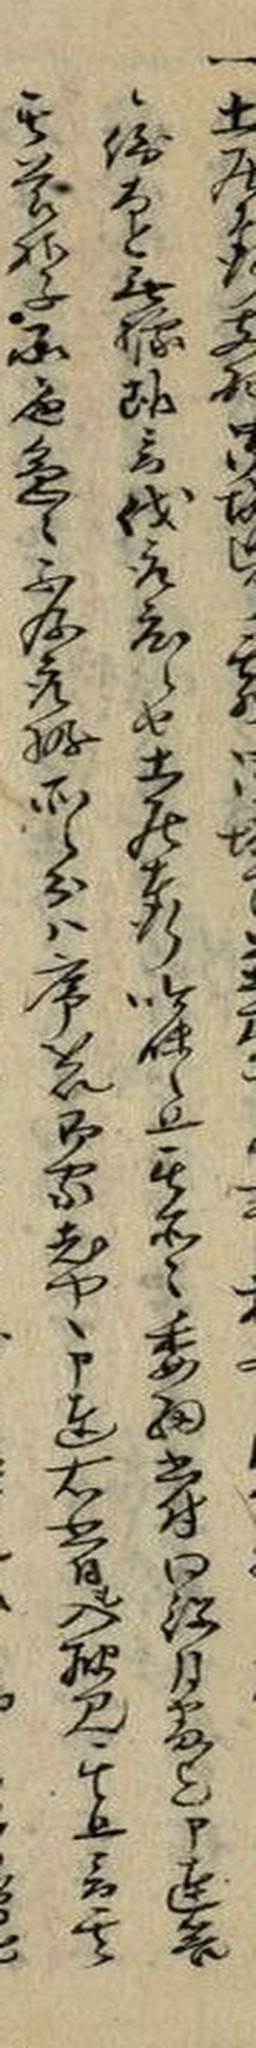其節様子承届急に不及取扱所之分は序を以御家老中へ申達右書付も入披見其上にて其
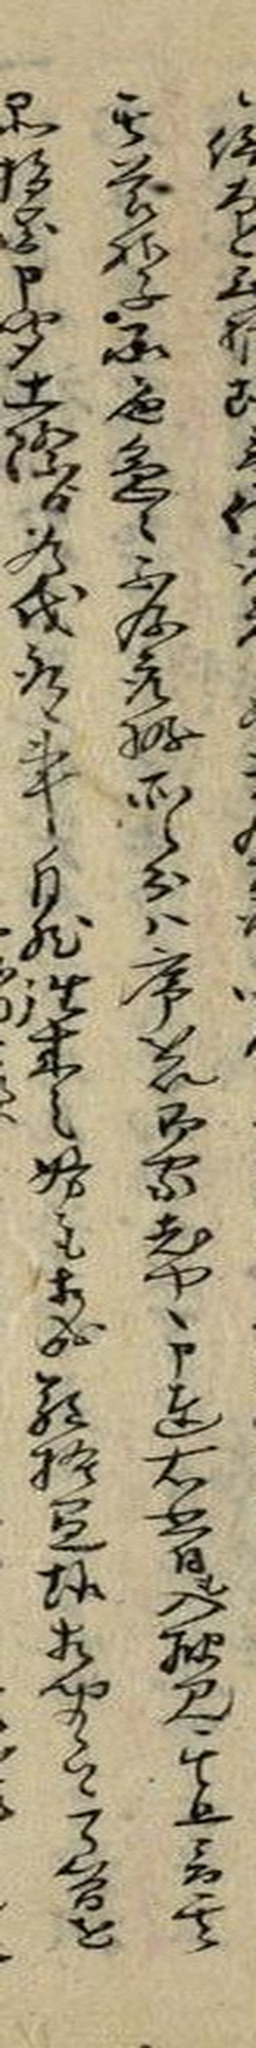品指図申聞土際ゟ為伐取候事自然往来之妨にも相成難捨置趣相聞候はゝ了簡を
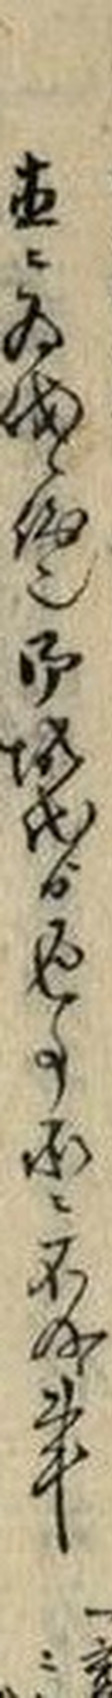直に為伐候儀也御城代ゟ返事承に不及候事
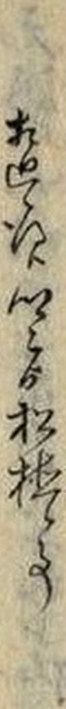相廻候得は郷々ゟ松植候事
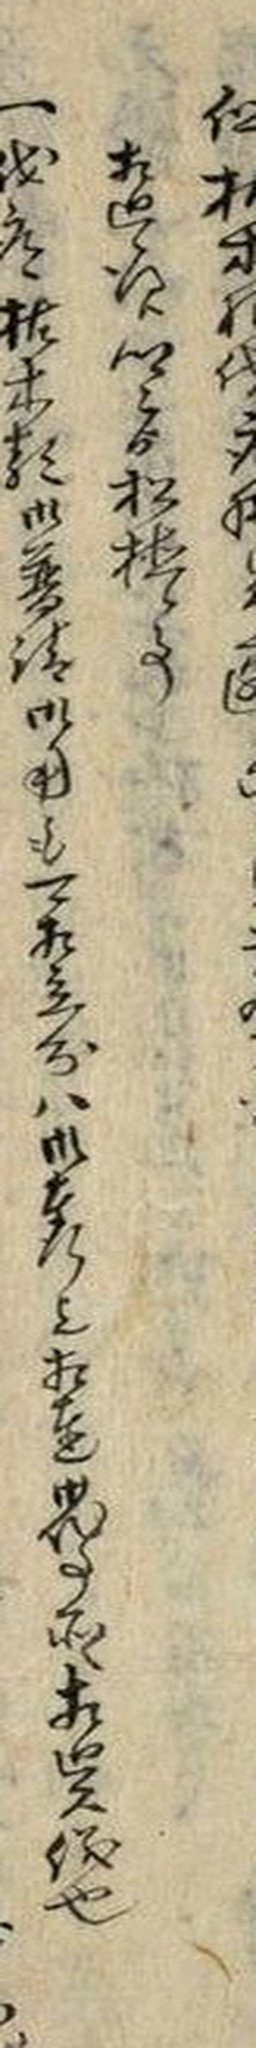一伐取候枯木類御普請御用にも可相立分は御奉行迄相達御作事所へ相廻ス儀也
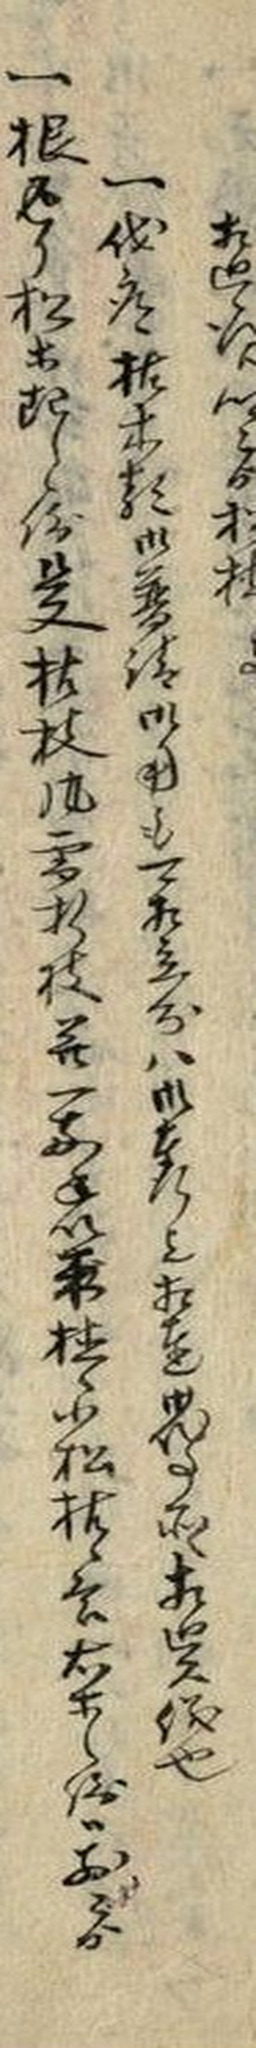一根返り松等起し候儀且又枯枝風雪折枝并一両年以来植候小松枯候節右等之儀は前々ゟ
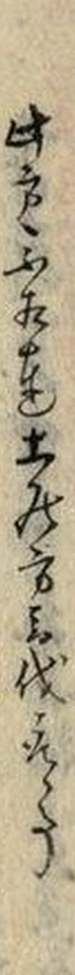此方へ不相達土居方にて伐取候事
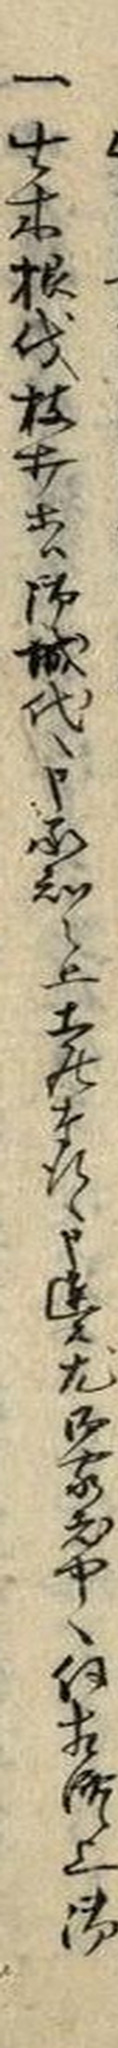一生木根伐枝打等は御城代へ申承知之上土居奉行へ申達ス尤御家老中へ伺相済候上御
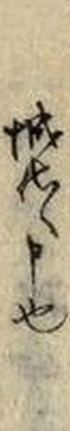城代へ申也
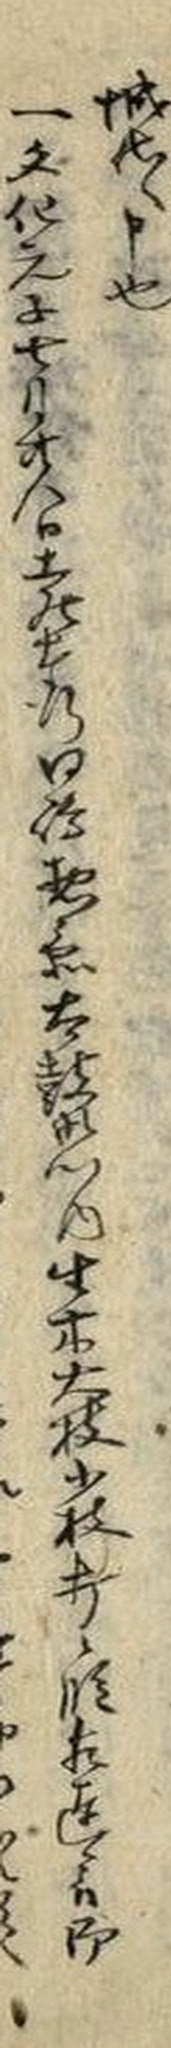一文化元子七月廿八日土居奉行田島惣兵衛太皷御門内生木大枝小枝打候段相達候に付御
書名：御城下諸事之部
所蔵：福井県文書館 Fukui Prefectural Archives
